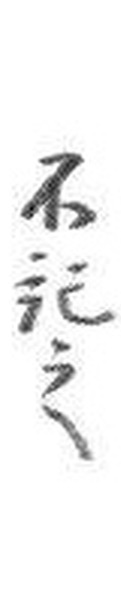不記之

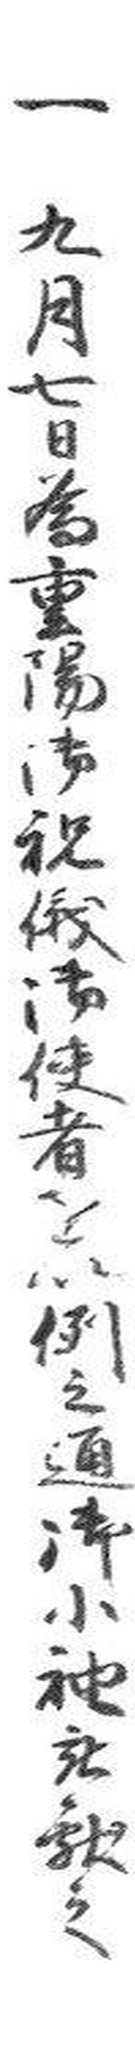一九月七日為重陽御祝儀御使者を以例之通御小袖被献之
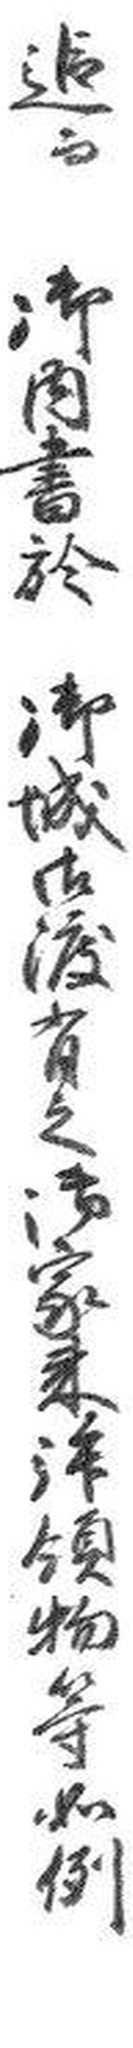追而御内書於御城御渡有之御家来拝領物等如例
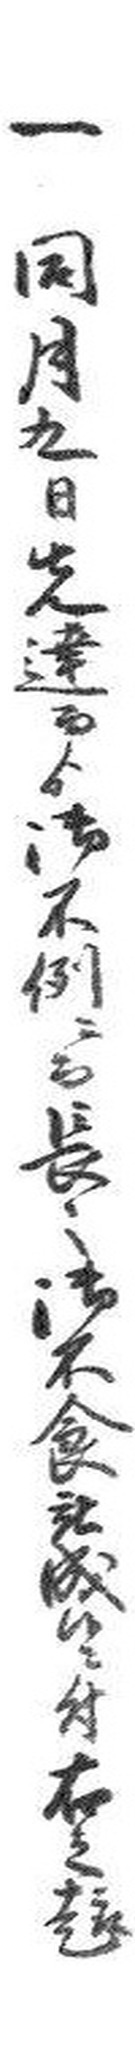一同月九日先達而ゟ御不例ニ而長々御不食被成候ニ付右之趣
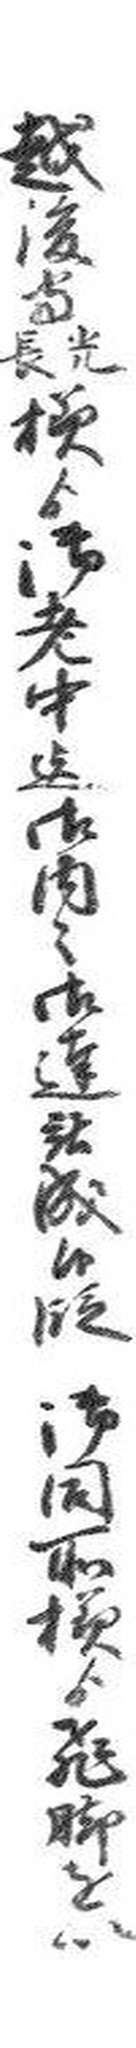越後守光長様ゟ御老中迄御内々御達被成候段御同所様ゟ飛脚を以
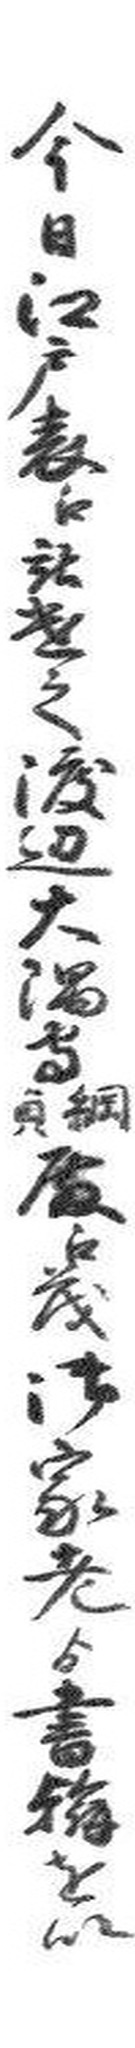今日江戸表江被遣之渡辺大隅守綱貞殿江も御家老ゟ書翰を以
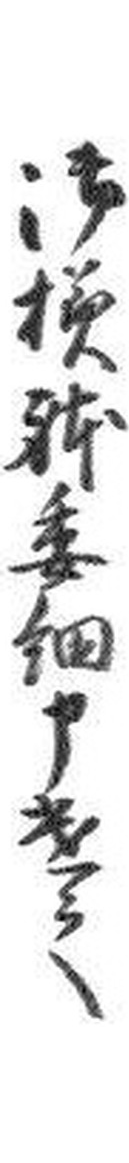御様体委細申遣之
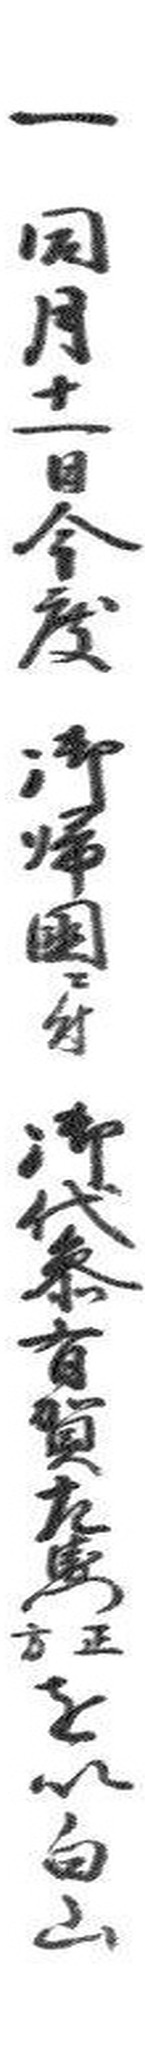一同月十一日今度御帰国ニ付御代参有賀左衛門正方を以白山
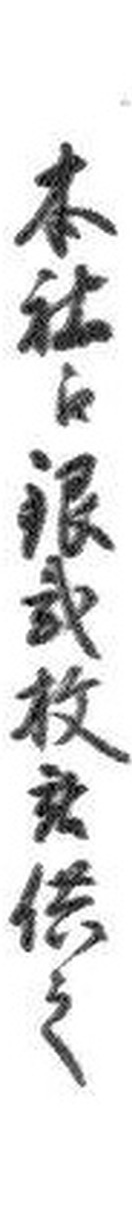本社江銀弐枚被供之
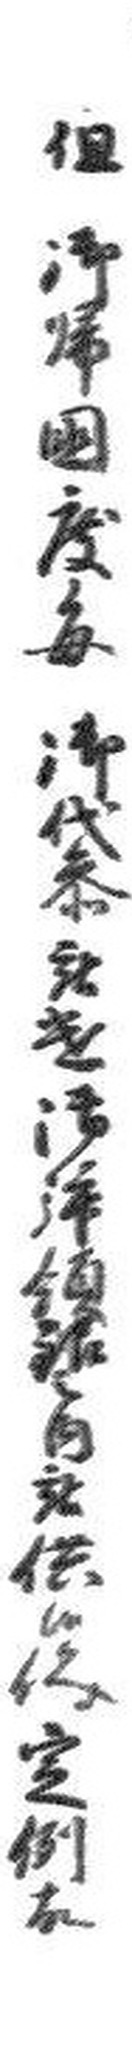但御帰国度毎御代参被遣御拝領銀之内被供候儀定例故
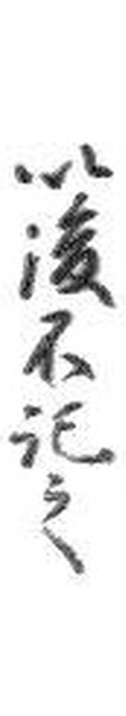以後不記之
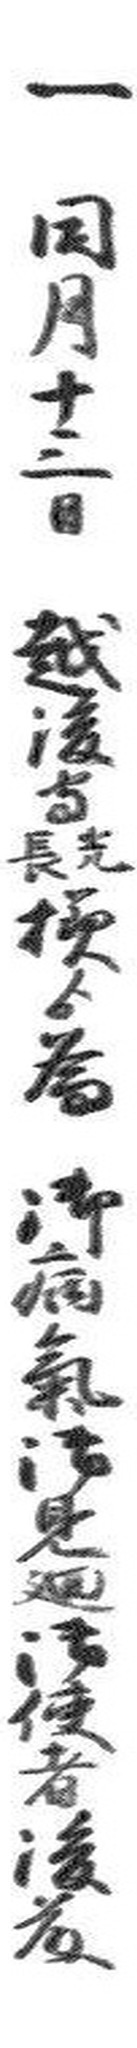一同月十三日越後守光長様ゟ為御病気御見廻御使者後藤
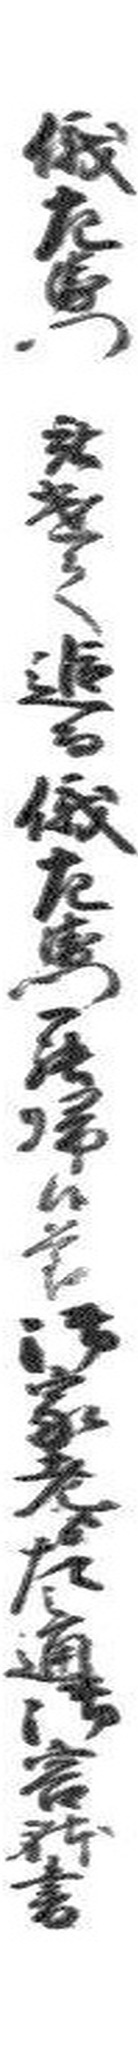儀左衛門被遣之追而儀左衛門罷帰候節御家老ゟ左之通御容体書
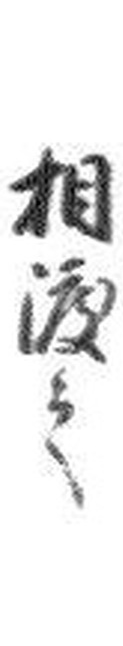相渡之
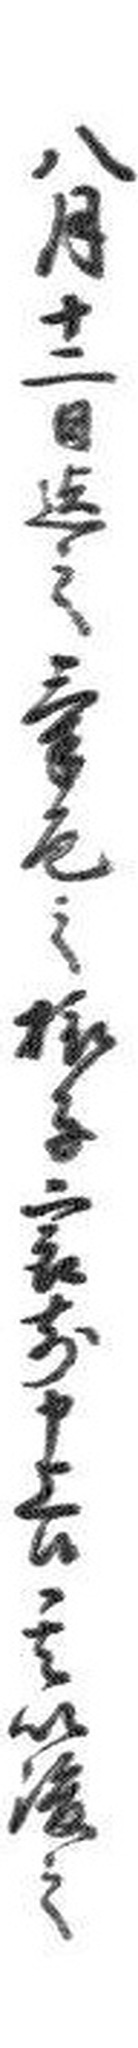八月十二日迄之気色之様子最前申上候其以後之
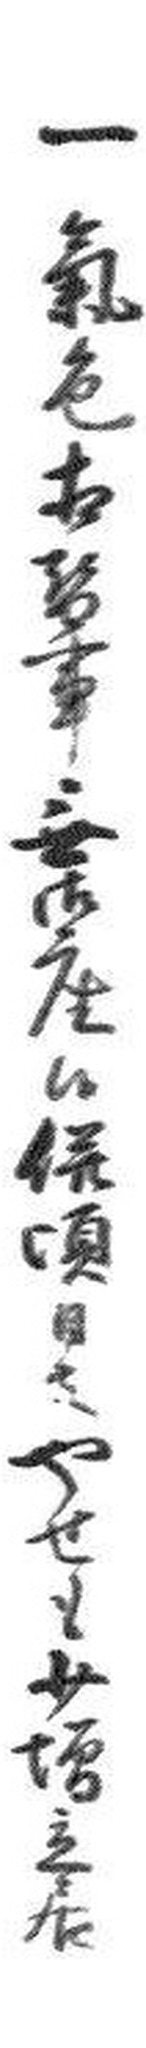一気色相替事無御座候併頃日者やせも少増立居
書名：家譜 八 光通公 従寛文十年到同十二年
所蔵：福井県文書館 Fukui Prefectural Archives
